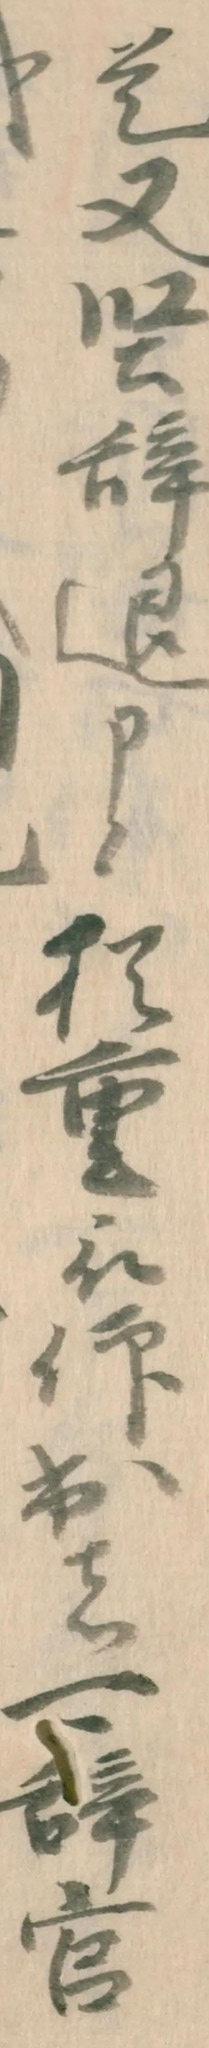是又堅辞退申候猶重被仰出は可辞官
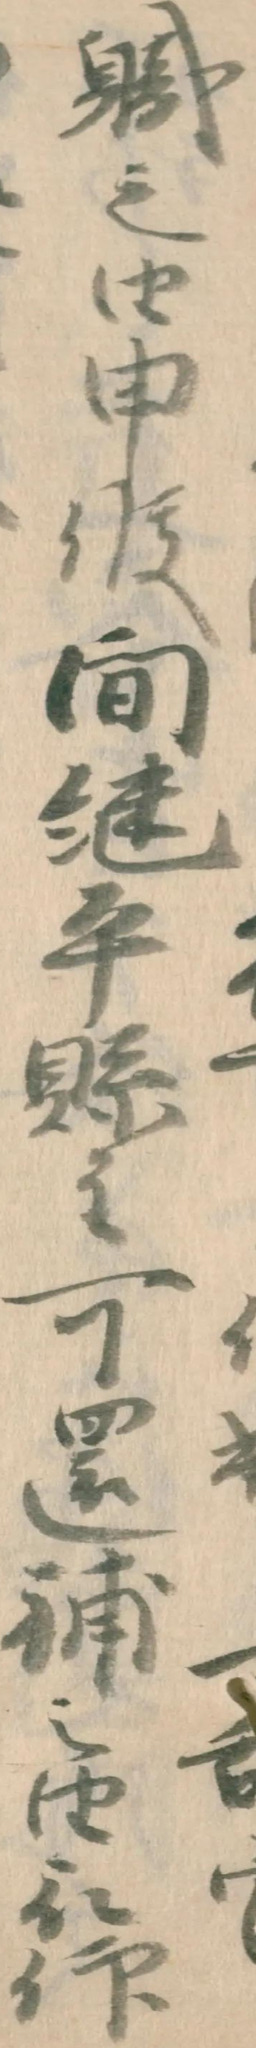職之由申候間継平県主可還補之由被仰
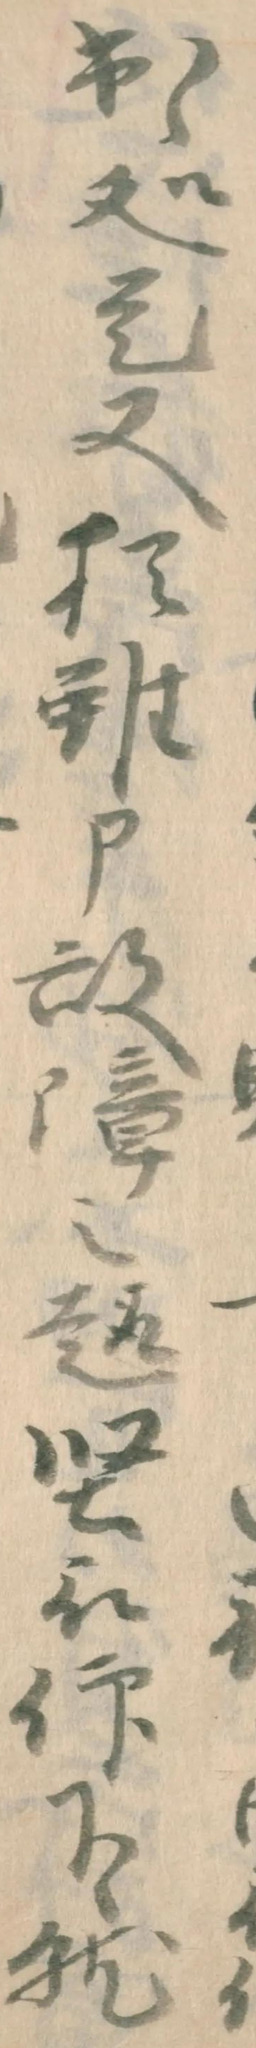出候処是又猶雖申故障之趣堅被仰下候就
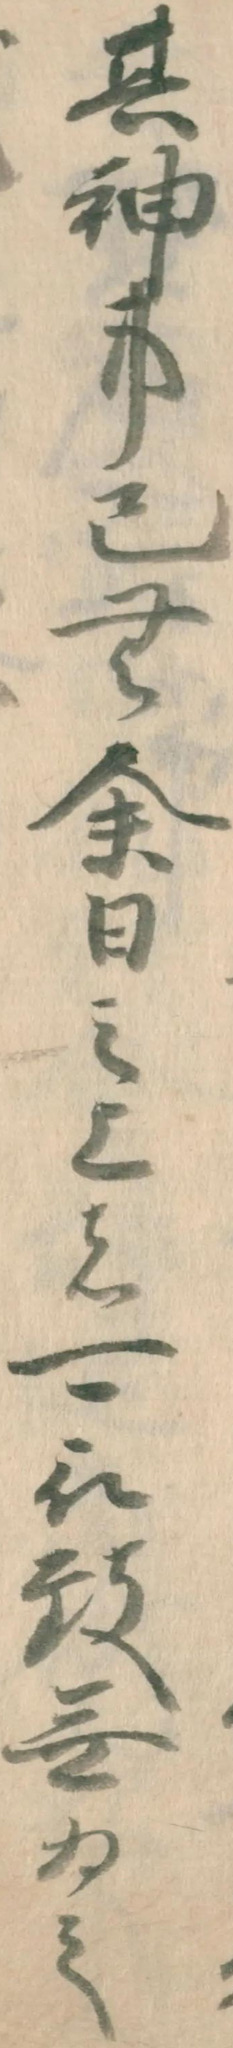其神事己無余日之上は可被致無為之
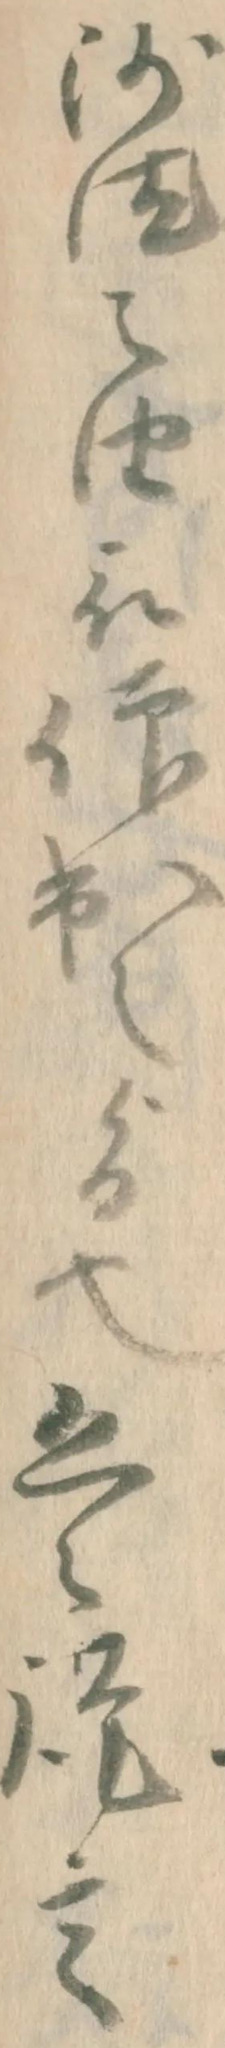沙汰之由被仰出之旨也恐々謹言

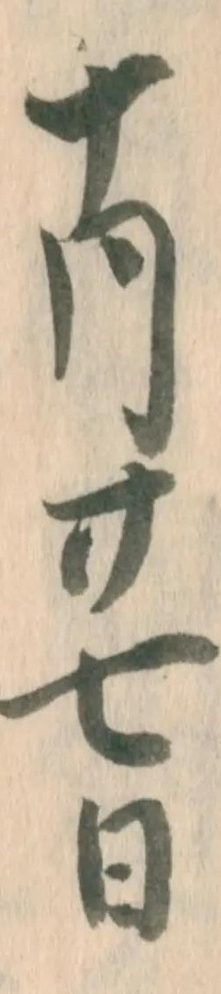十月廿七日
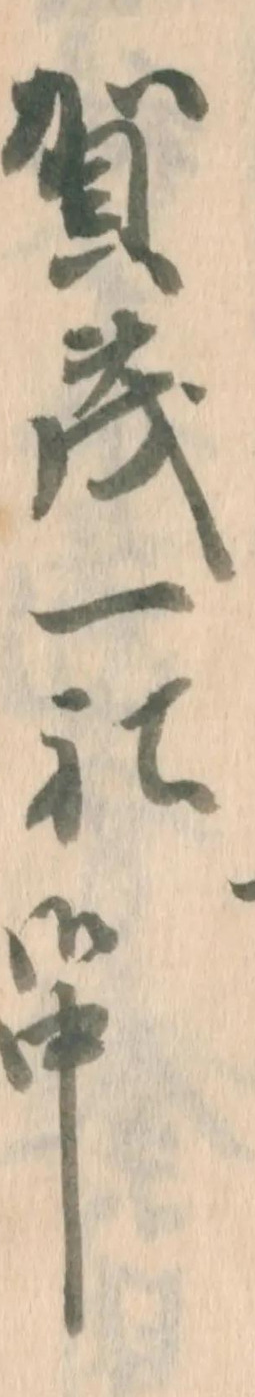賀茂一社御中
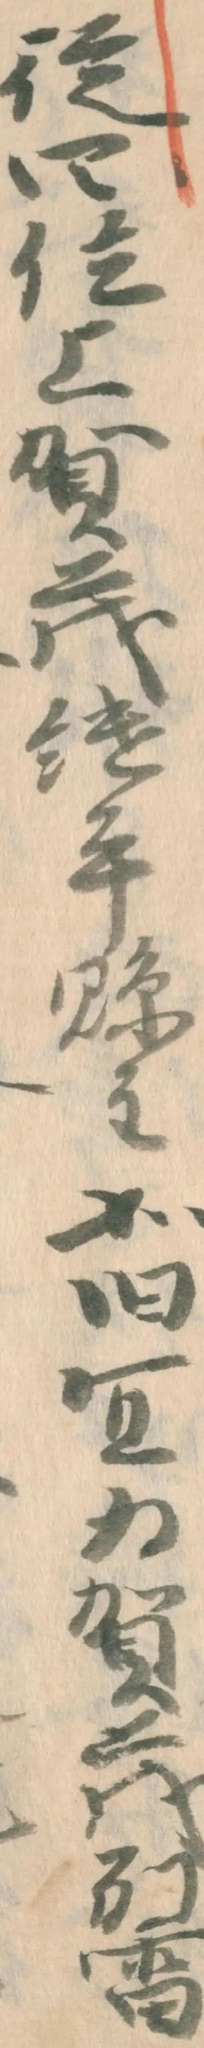従四位上賀茂継平県主如旧宜為賀茂別雷
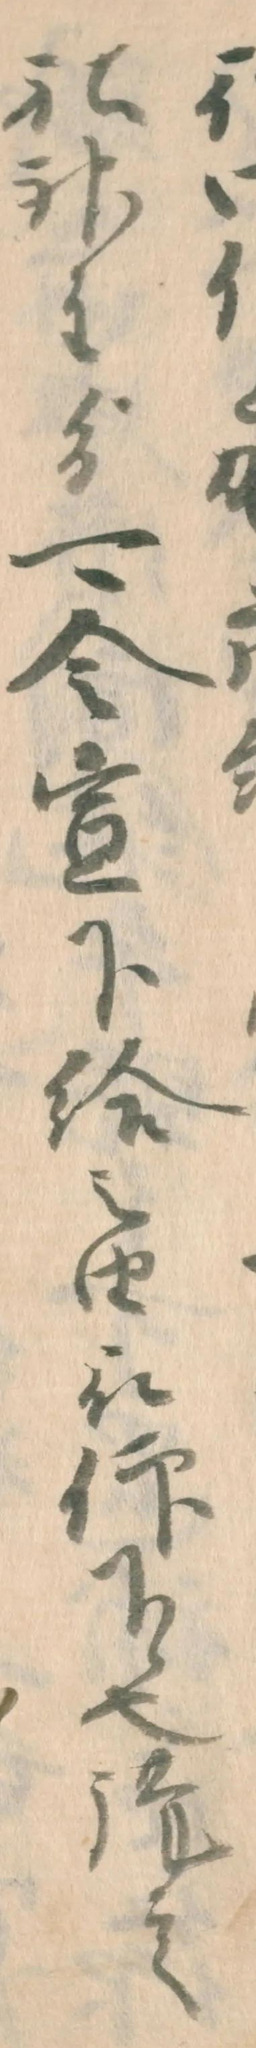社神主旨可令宣下給之由被仰下候也謹言
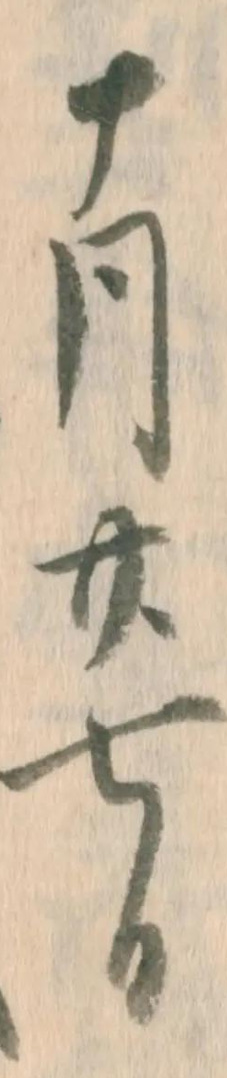十月廿七日
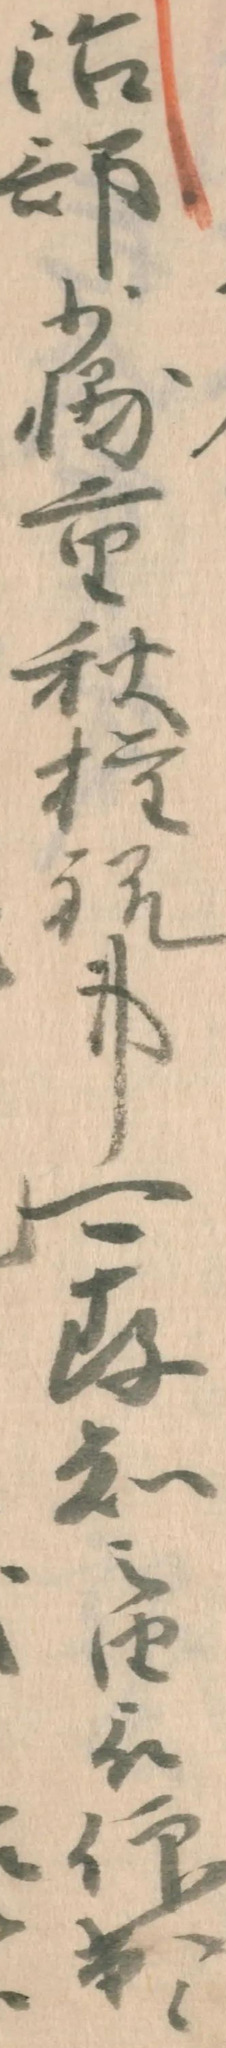治部少輔重秋権祝事可存知之由被仰出候
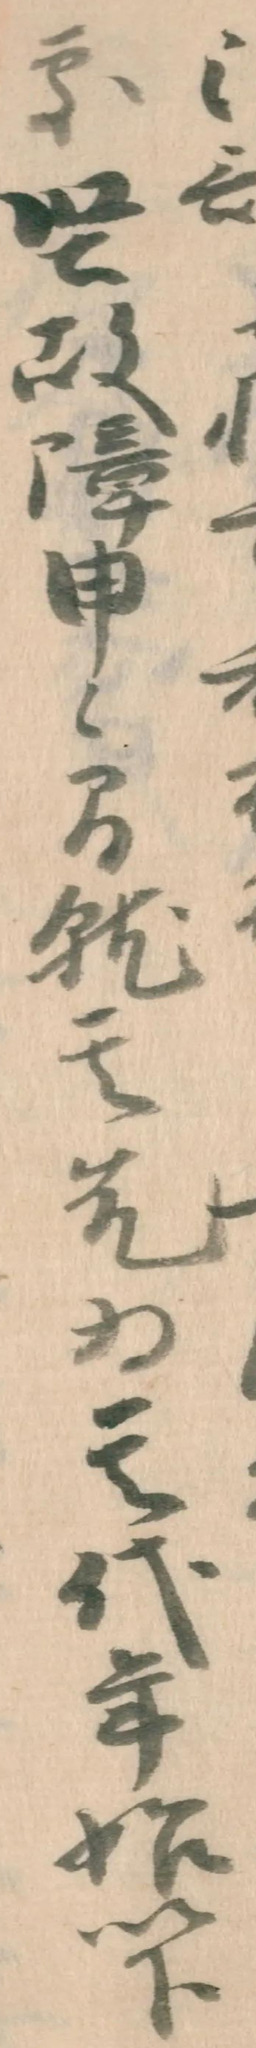処堅故障申候間就其先為其代年始以下
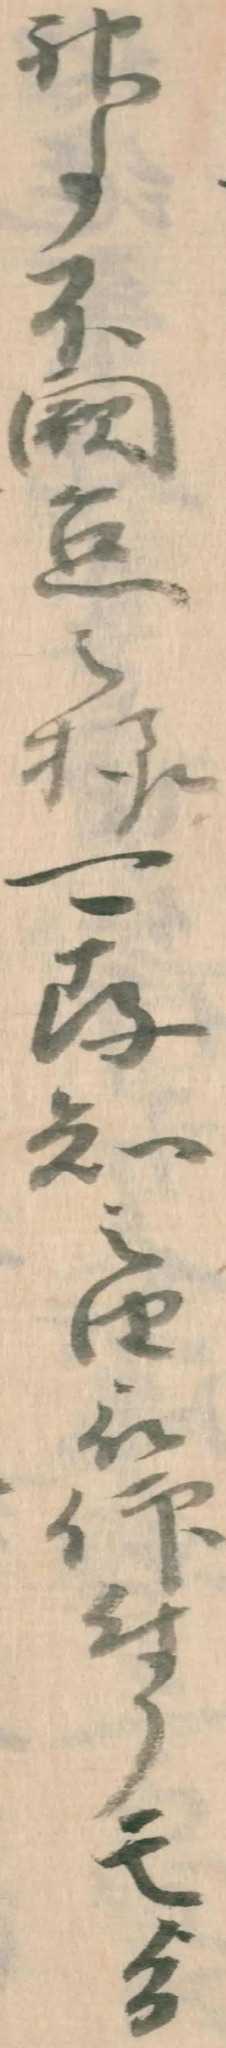神事不闕怠之様可存知之由被仰付了其旨
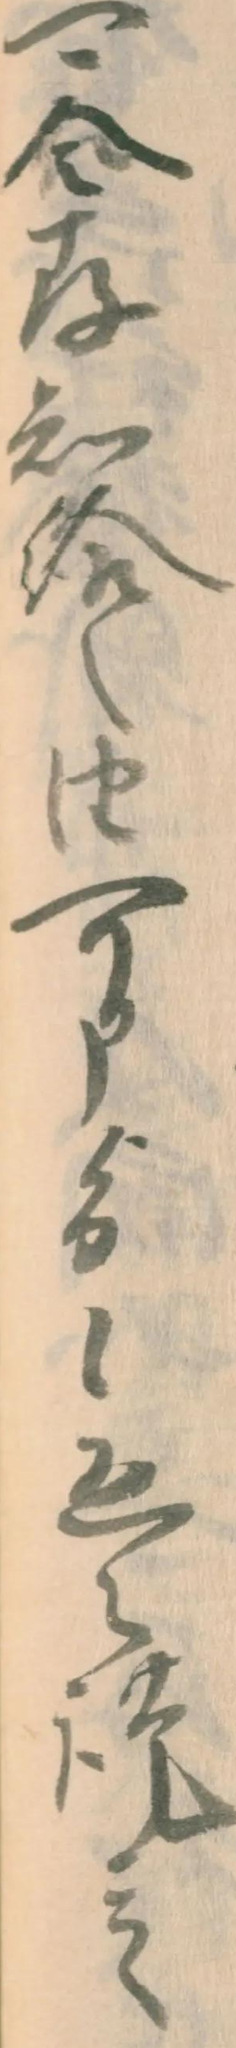可令存知給之由可申旨候恐々謹言
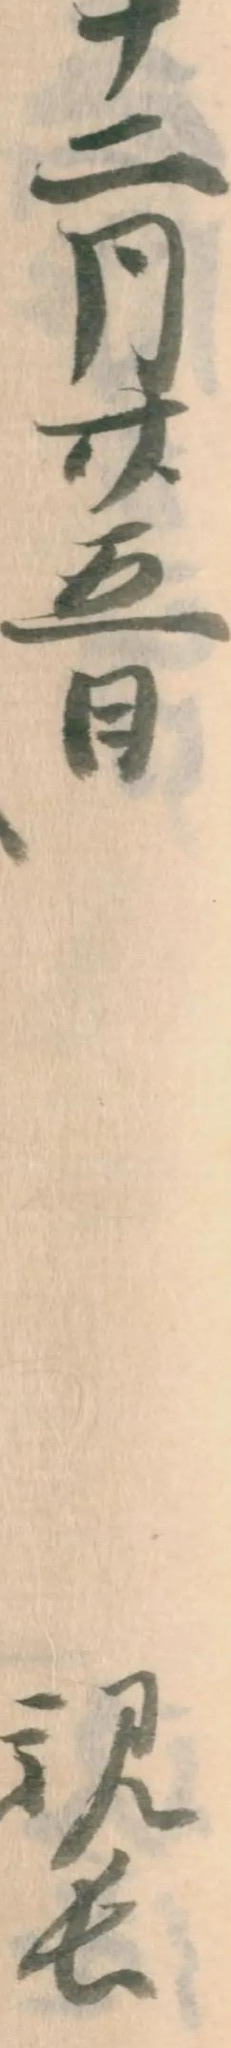十二月廿五日親長
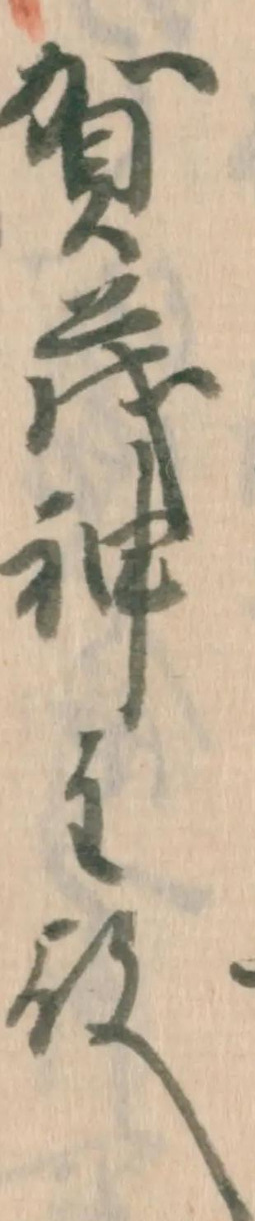賀茂神主殿
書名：賀茂社記録. 第1冊
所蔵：国立国会図書館 National Diet Library, JAPAN
